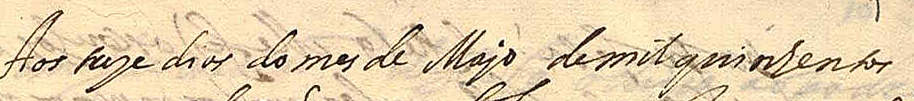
Aos treze dias do mes de Majo de mil quinhentos
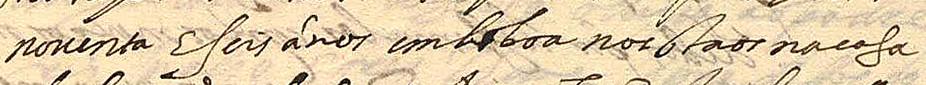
nouenta E seis ānos em lisboa nos staos na casa
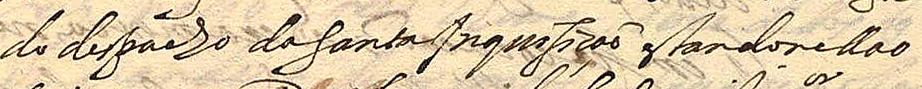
do despacho da santa Jnquisiçaõ estando nella o
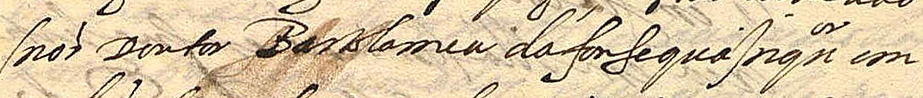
snor̄ Doutor Bartolameu da fonsequa Jnquor em
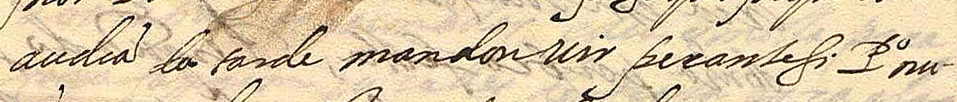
audiā da tarde mandou uir perante si Po nu
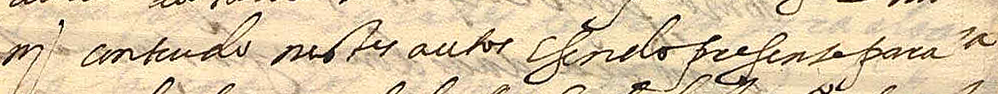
nz̄ conteudo nestes autos E sendo presente para
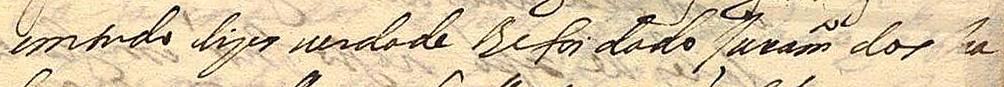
em tudo dizer uerdade lhe foi dado Juramto dos
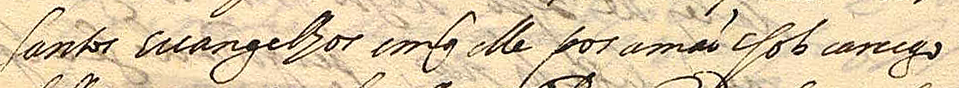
Santos Euangelhos em q̄ elle pos a maõ E sob carrego
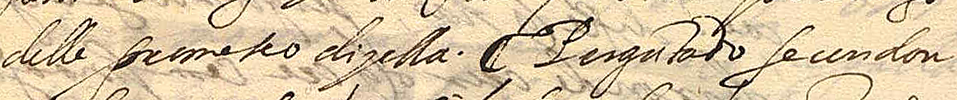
delle prometeo dizella. ¶ Pergūtado se cuidou
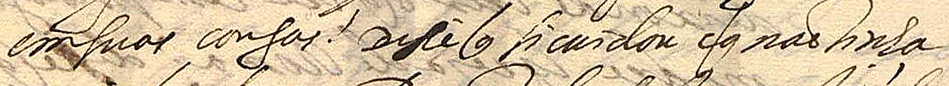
em suas cousas? Disse q̄ si cuidou e q̄ naõ tinha
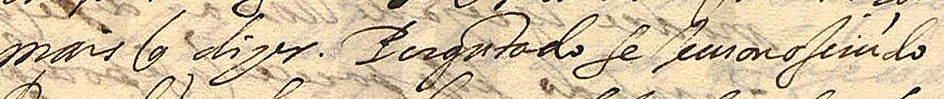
mais q̄ dizer. Pergūtado se Jeiuou o Jeiū do
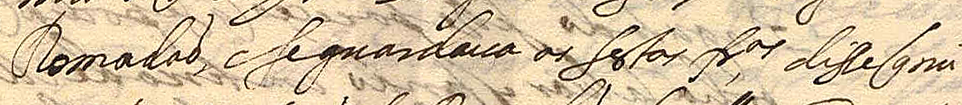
Romadaõ, e se guardaua as sestas fr.as disse q̄ nū
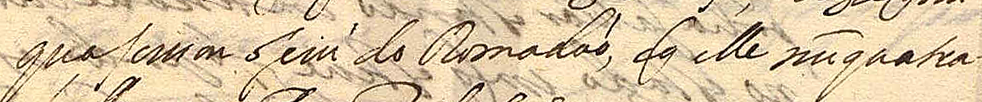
qua Jeiuou o Jeiū do Romadaõ, e q̄ elle nūqua tra
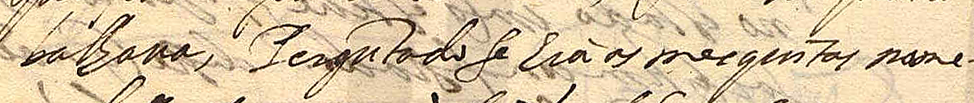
balhaua, Pergūtado se hia as mesquitas nome
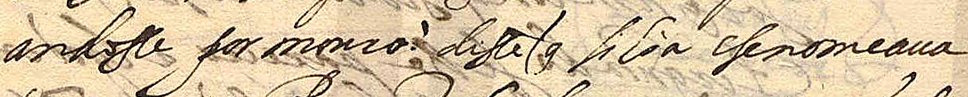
andosse por mouro disse q̄ si hia e se nomeaua
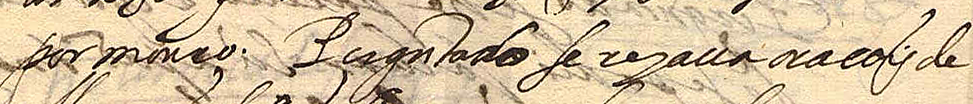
por mouro. Pergūtado se rezaua oraçoĩs de
